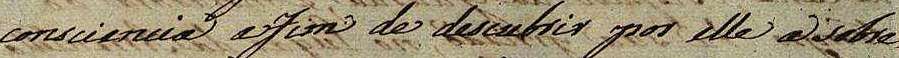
consciencia afim de descubrir por ella a sobre
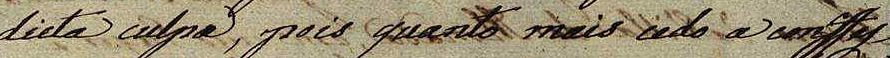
dicta culpa, pois quanto mais cedo a conffes
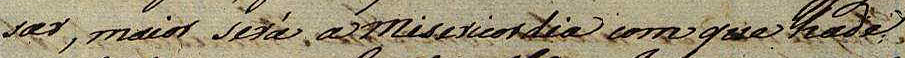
sar, maior será a misericordia com que hade
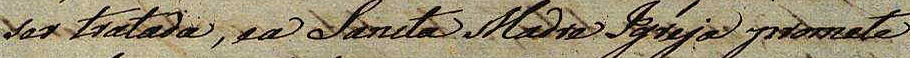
ser tratada, e a Sancta Madre Igreja promete
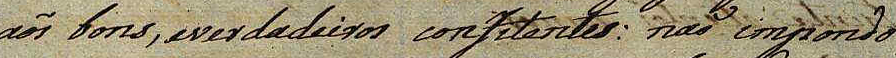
aõs bons, e verdadeiros confitentes: naõ impondo
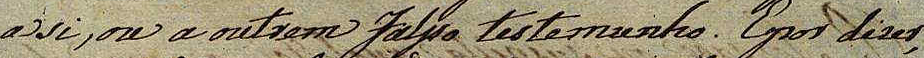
a si, ou a outrem falsso testemunho. E por dizer,
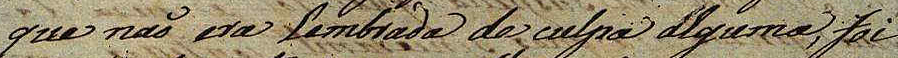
que naõ era Lembrada de culpa alguma, foi
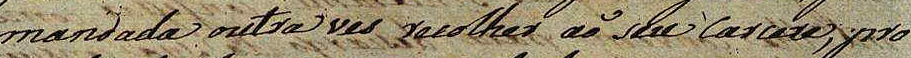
mandada outra ves recolher ao seu carcere, pro
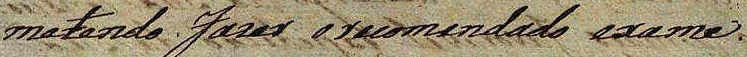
metendo fazer o recomendado exame.
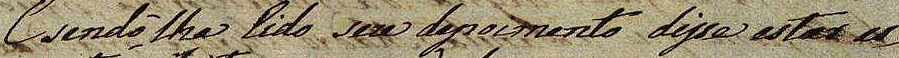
E sendo-lhe lido seu depoimento disse estar es
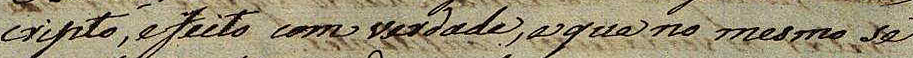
cripto, e feito com verdade, a que no mesmo se
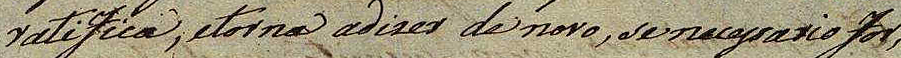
ratifica, e torna a dizer de novo, se necessario for,
